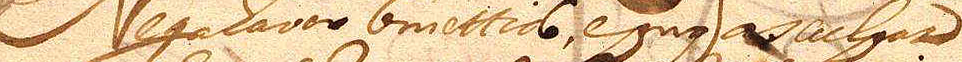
Nega haver Comettido, e porq̄ as culpas
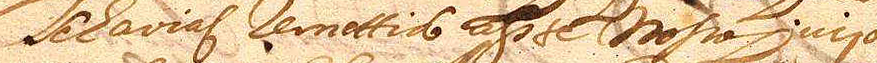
se haviaõ Remettido a este nosso juizo
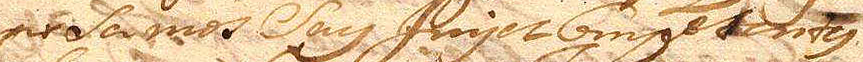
por sermos Seus Juises Competentes
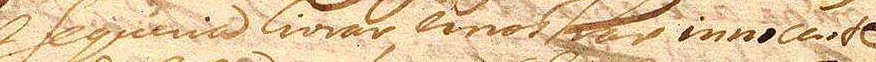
e se queria livrar, e mostrar innocente
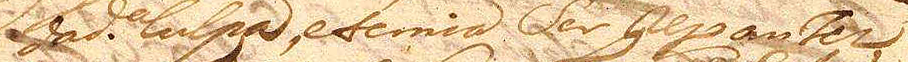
da d.a culpa, e temia Ser prezo antes
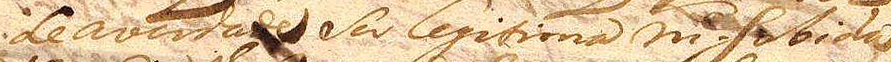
de a verdade ser legitimam.te sabida
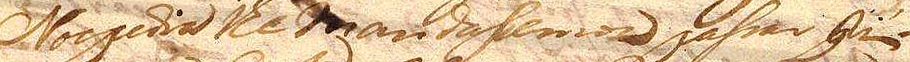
Nos pedia lhe mandassemos passar pri
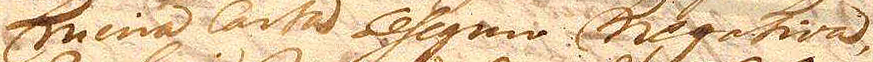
meira carta de seguro negativa,
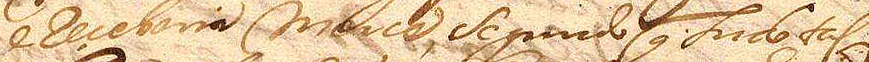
e Receberia Merce, segundo q̄ tudo taõ
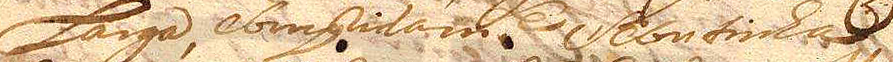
Larga, e compridam.te se continha
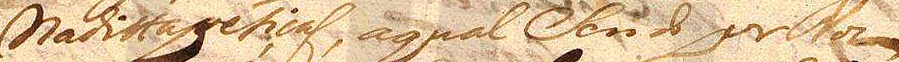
na ditta petiçaõ, a qual Sendo por Nos
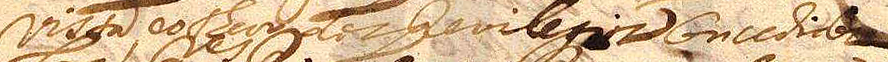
vista, e o theor dos previlegios concedidos
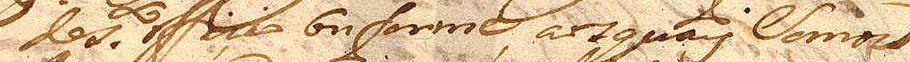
do s.to officio conforme, aos quais Somos
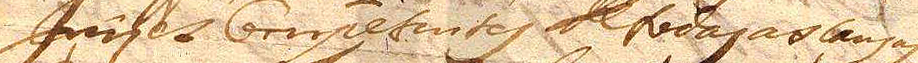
Juizes Competentes de todas as causas
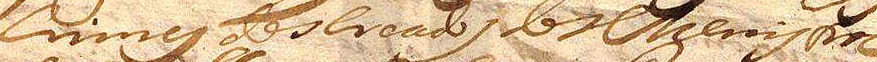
Crimes dos creados dos Menistros
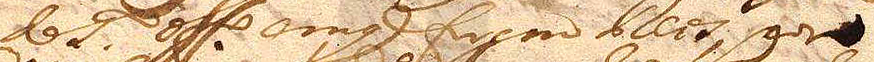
do s.to off.o em q̄ forem Reos, por
